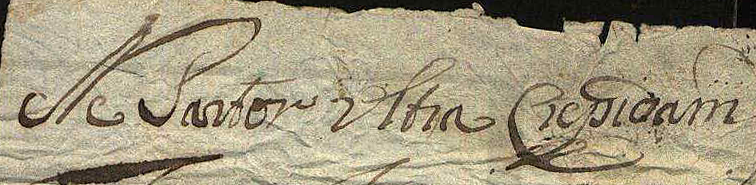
Ne Sutor vltra Crepidam
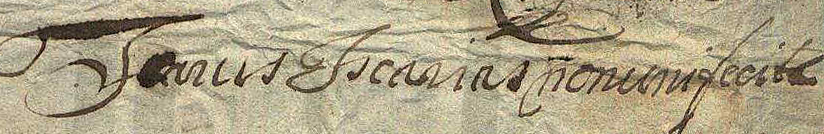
F_arus Iscarias non usci fecit_
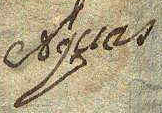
Aquas
